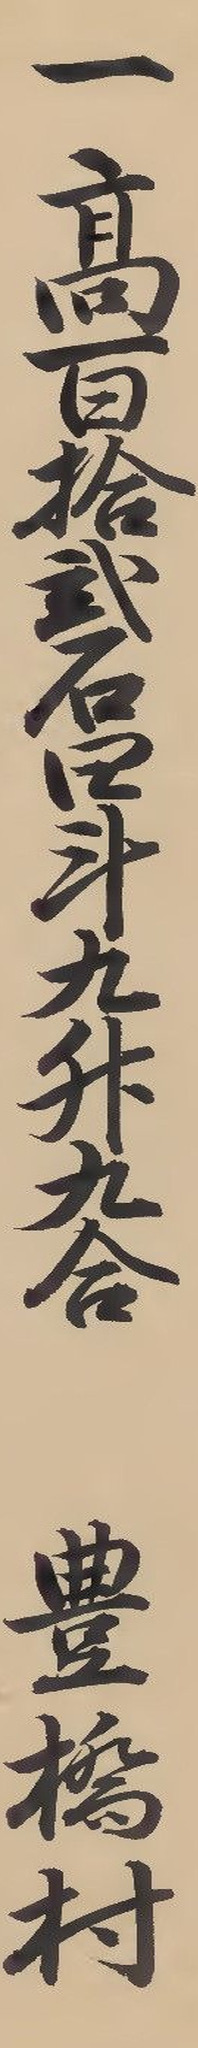一高百拾弐石四斗九升九合豊橋村
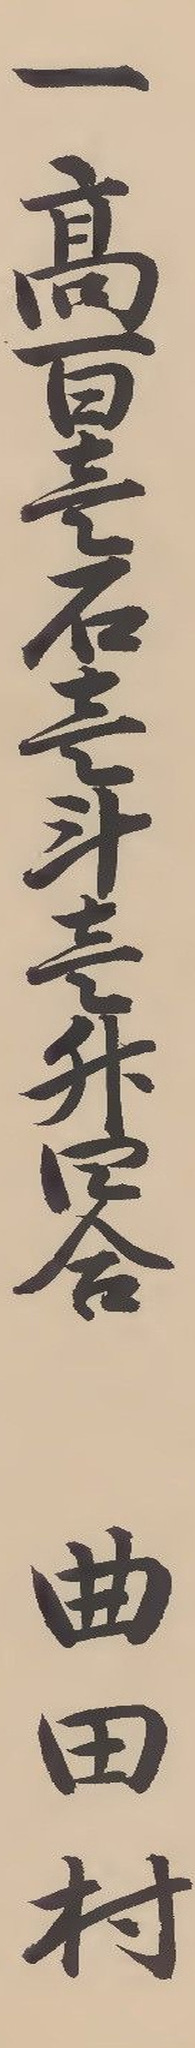一高百壱石壱斗壱升四合曲田村
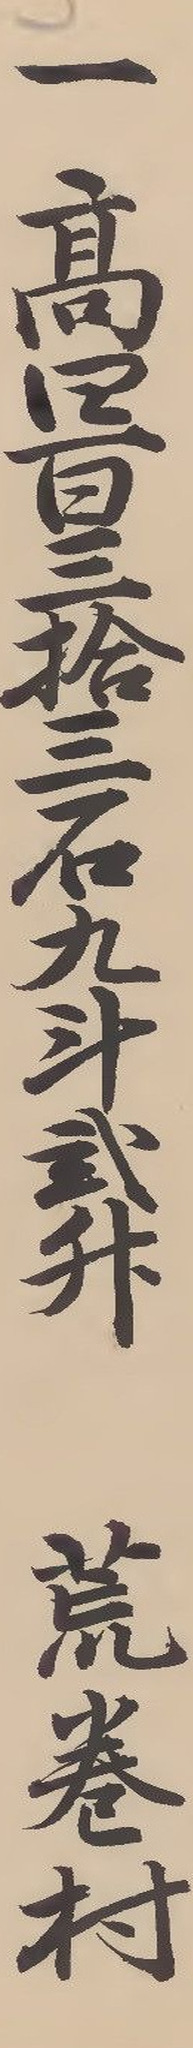一高四百三拾三石九斗弐升荒巻村
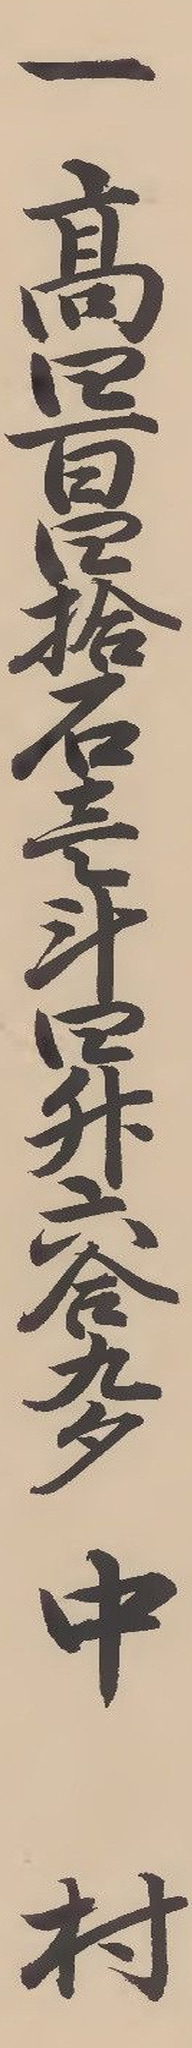一高四百四拾石壱斗四升六合九勺中村
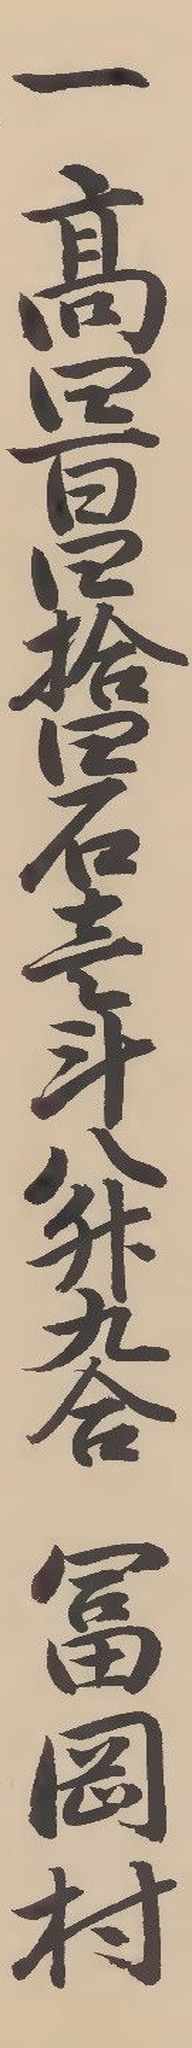一高四百四拾四石壱斗八升九合富岡村

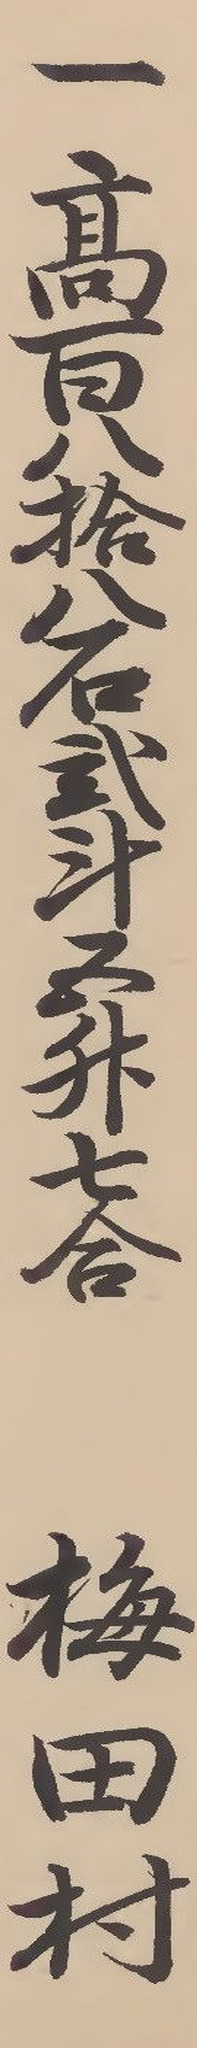一高百八拾八石弐斗五升七合梅田村
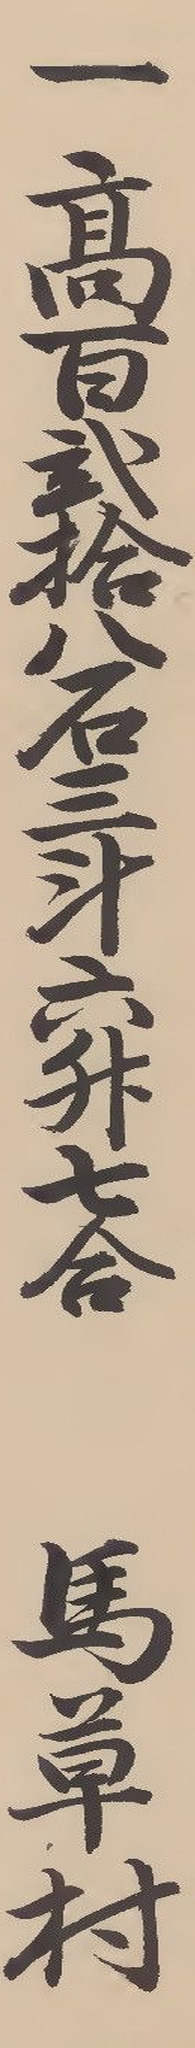一高百弐拾八石三斗六升七合馬草村
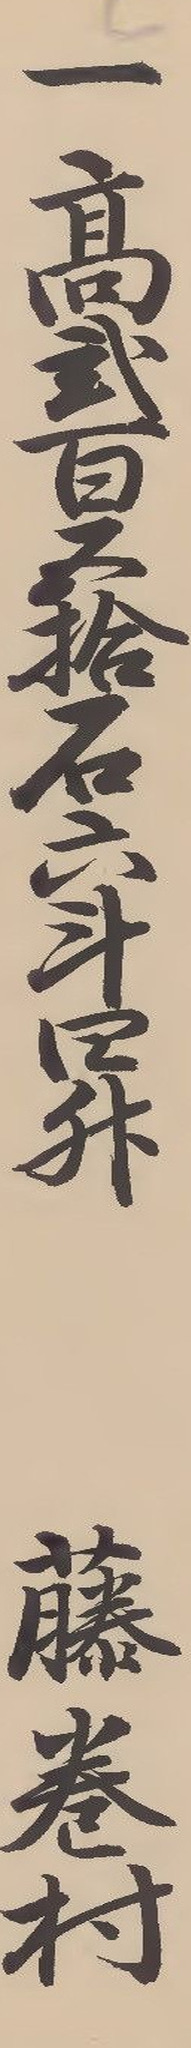一高弐百五拾石六斗四升藤巻村
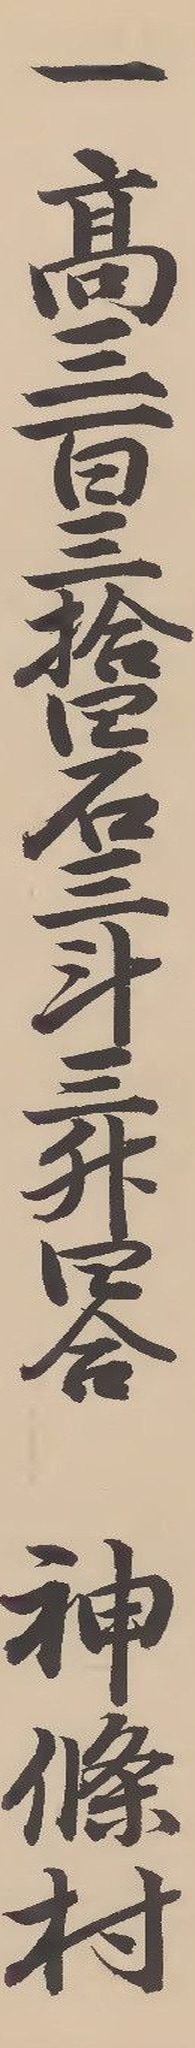一高三百三拾四石三斗三升四合神条村
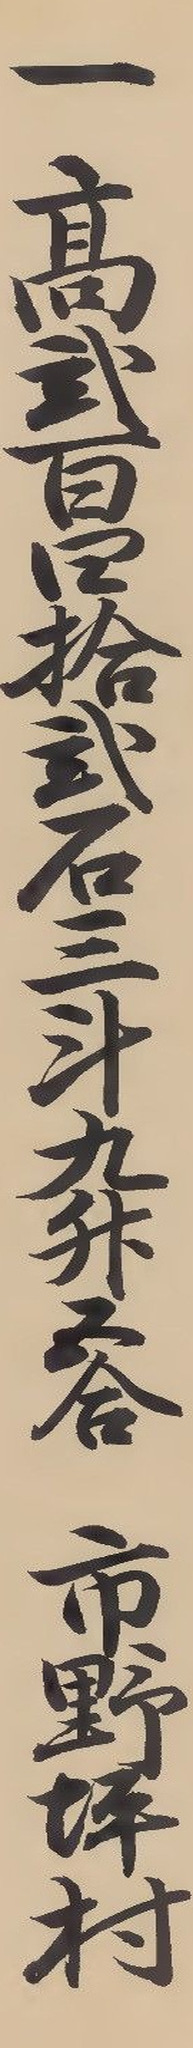一高弐百四拾弐石三斗九升五合市野坪村
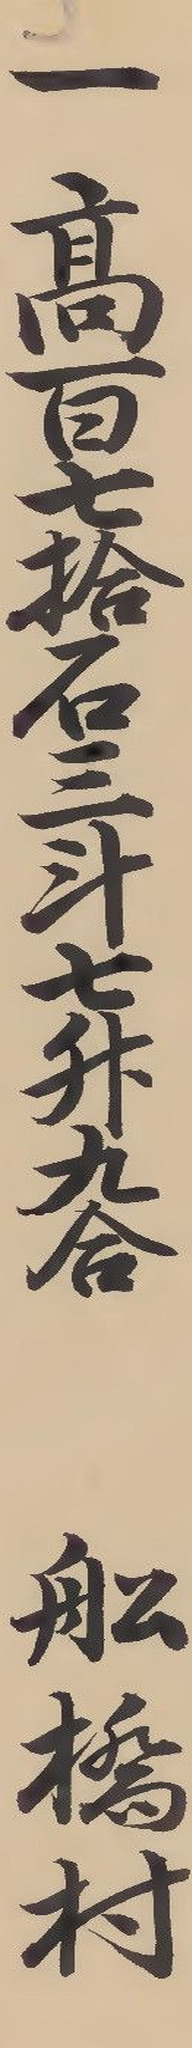一高百七拾石三斗七升九合船橋村
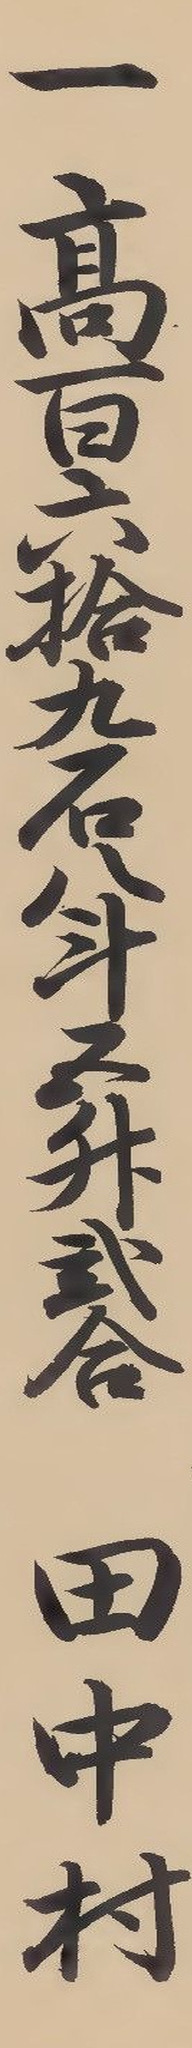一高百六拾九石八斗五升弐合田中村
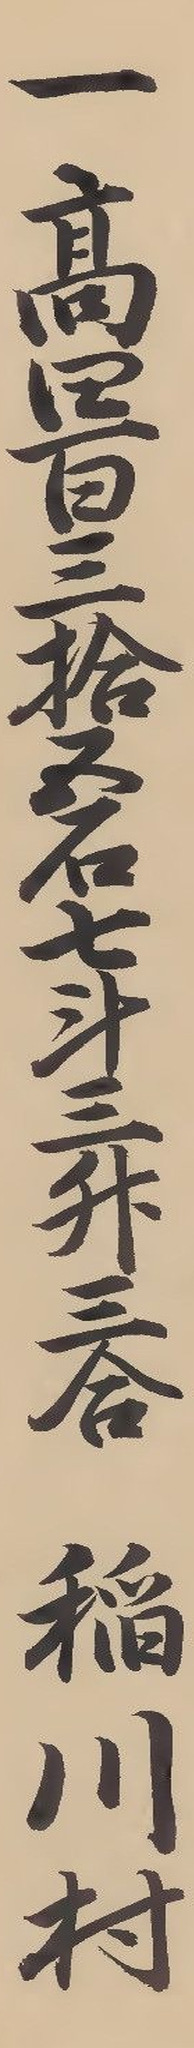一高四百三拾五石七斗三升三合稲川村

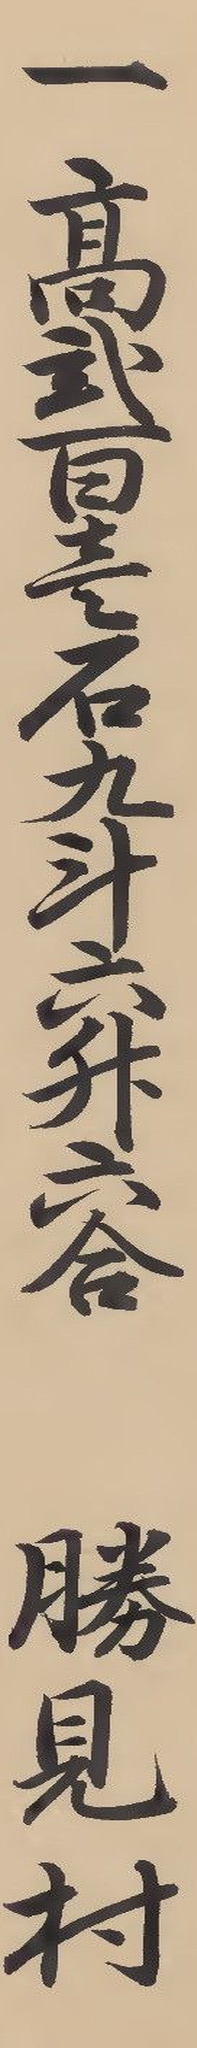一高弐百壱石九斗六升六合勝見村
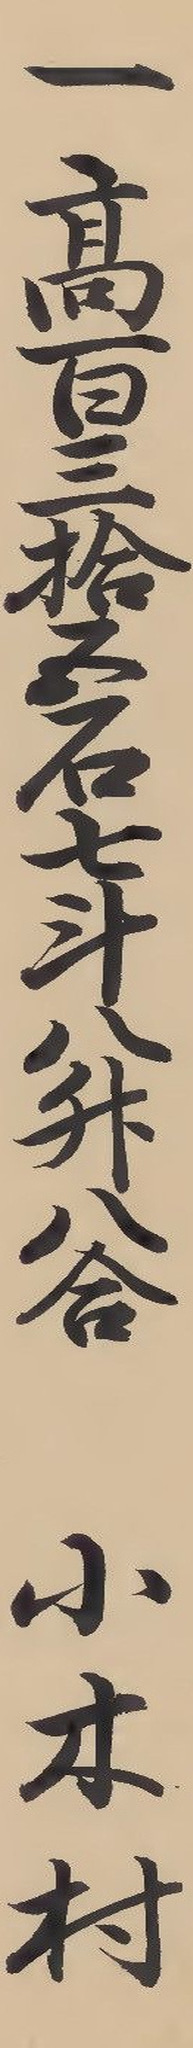一高百三拾五石七斗八升八合小木村
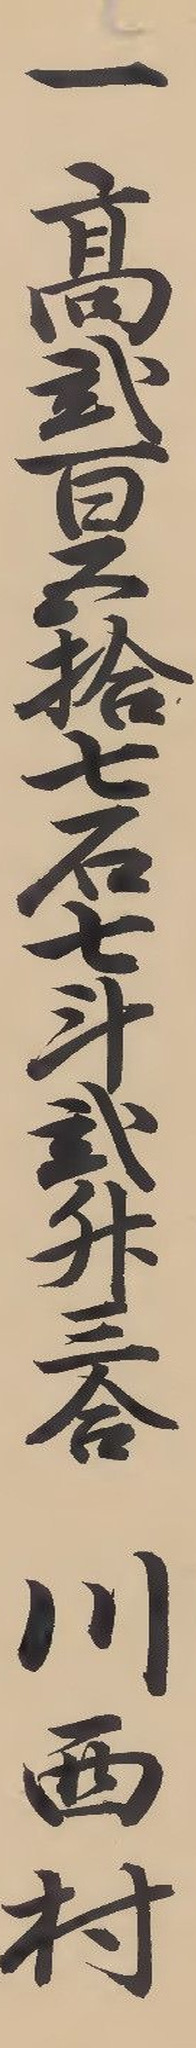一高弐百五拾七石七斗弐升三合川西村
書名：越後国郷帳　中
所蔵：国立公文書館 National Archives of Japan
